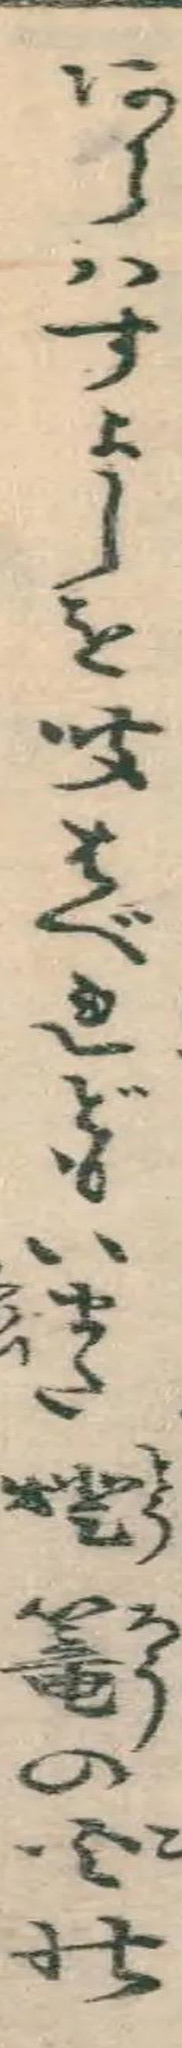あらはすよしを聞はべれどもいまた灯篭の火の
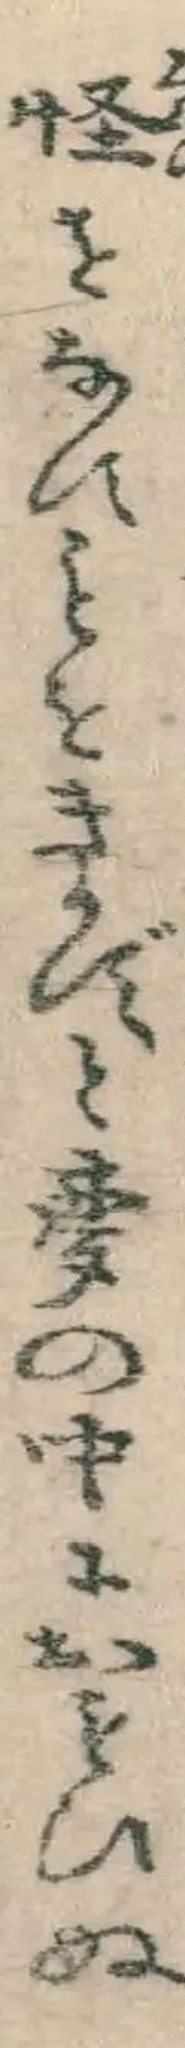怪をなすことをきかずと夢の中におもひぬ
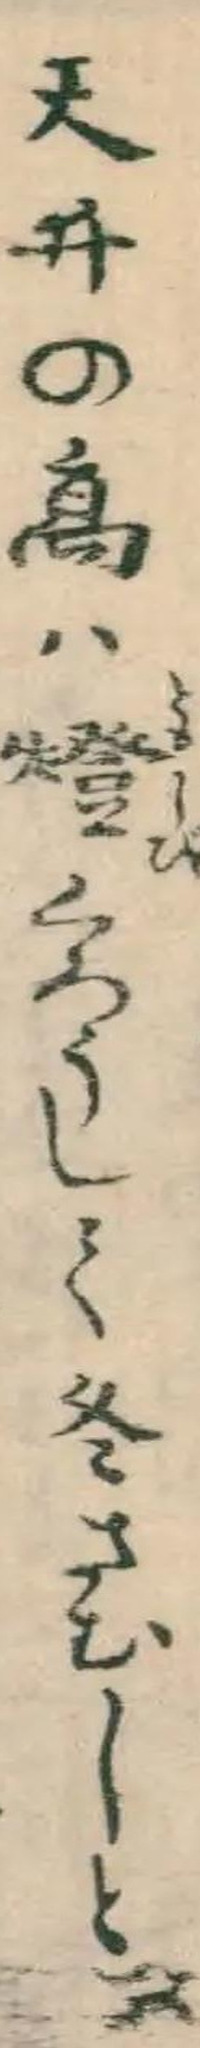天井の高は燈くろうして冬さむしと
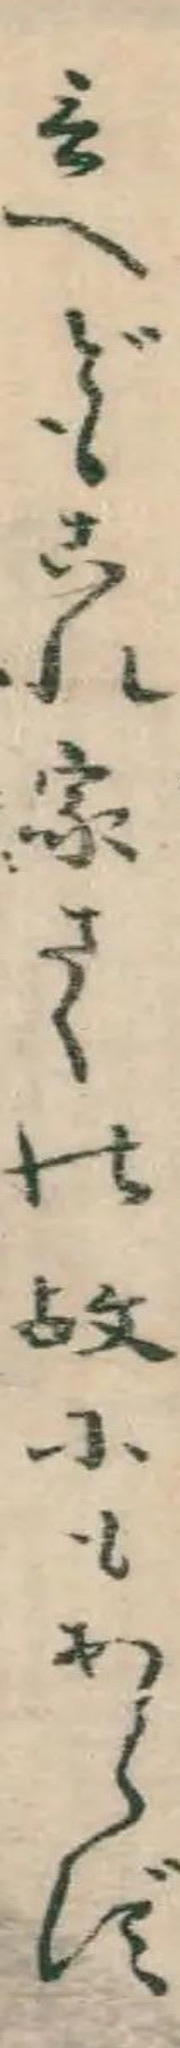言へどもこれ家さくの故にもあらず
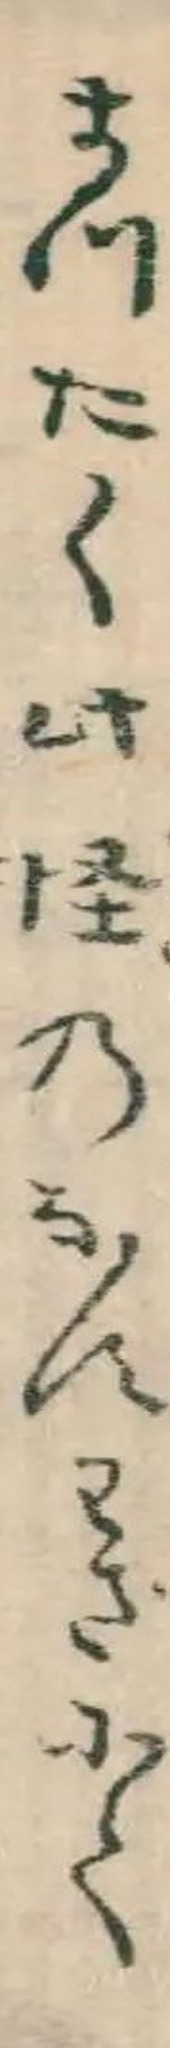まつたく此怪のなすわざにて
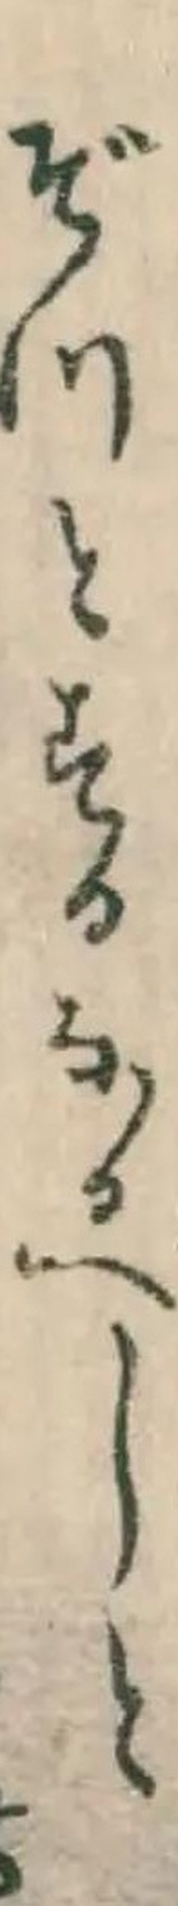ぞつとするなるへしと
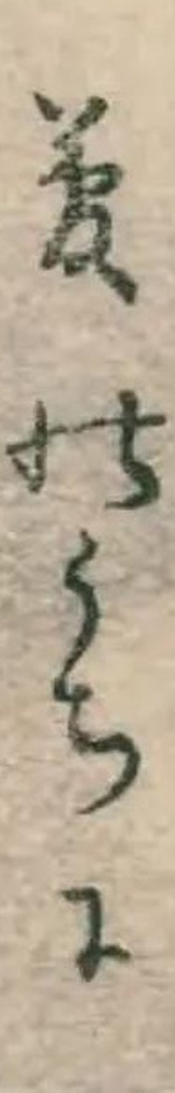夢のうちに
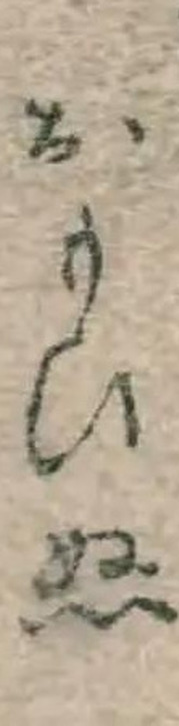おもひぬ

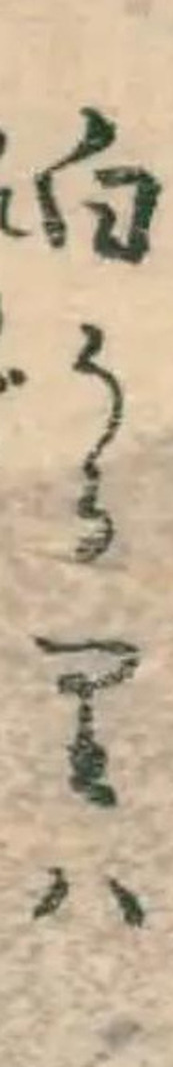白うるりは
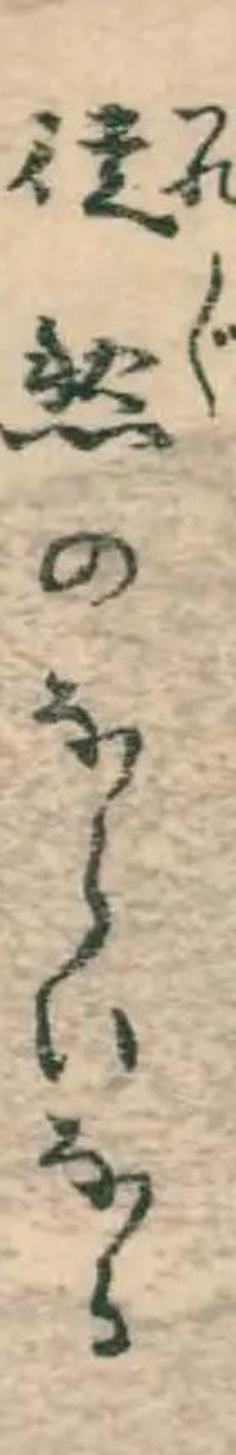徒然のならいなる
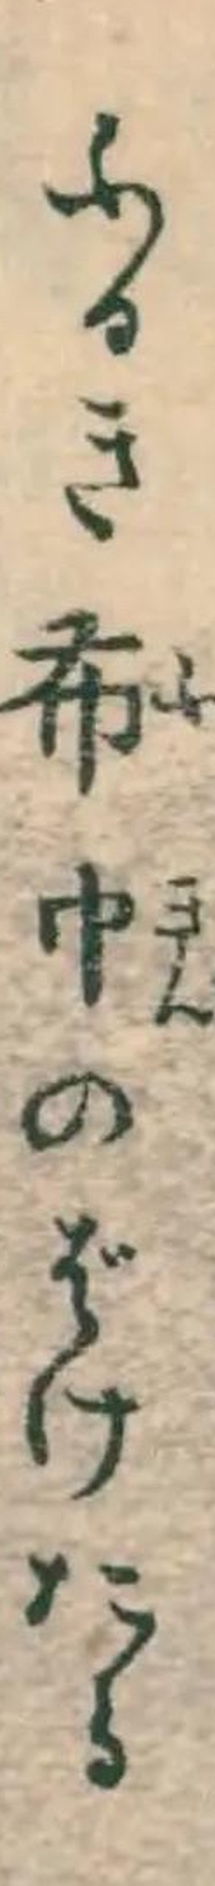ふるき布巾のばけたる
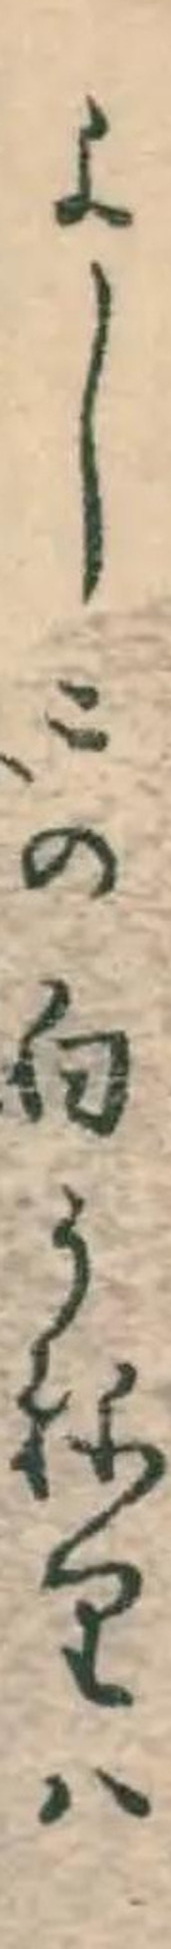よしこの白うねりは
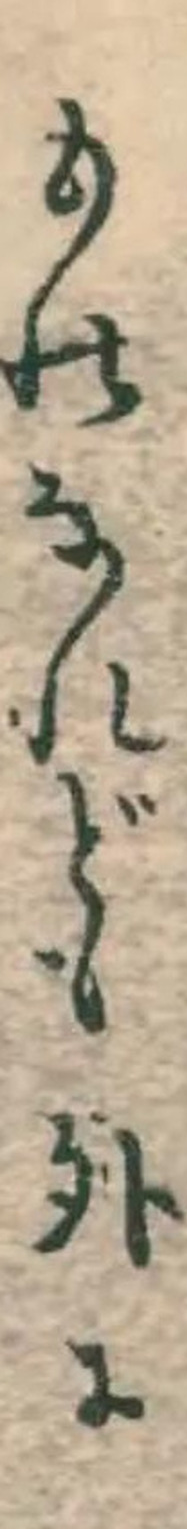ものなれども外に
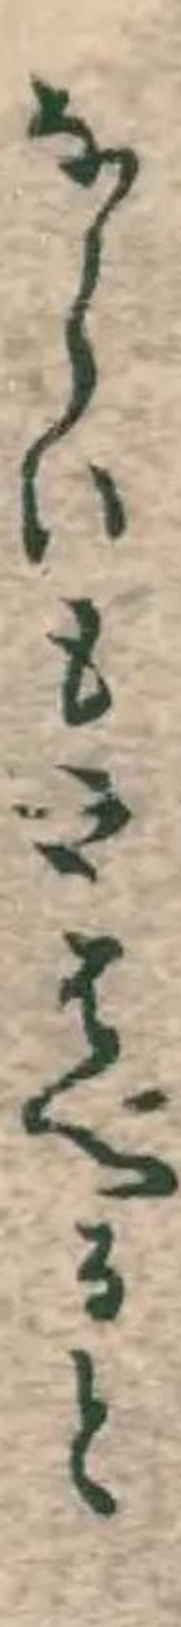ならいもやはべると
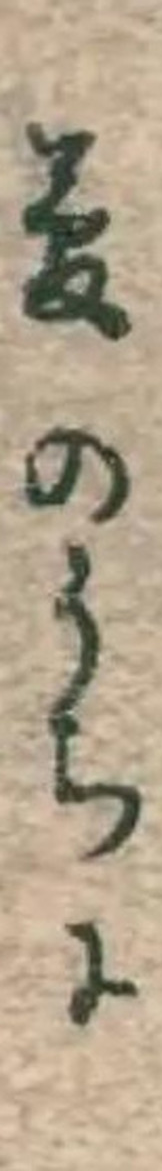夢のうちに
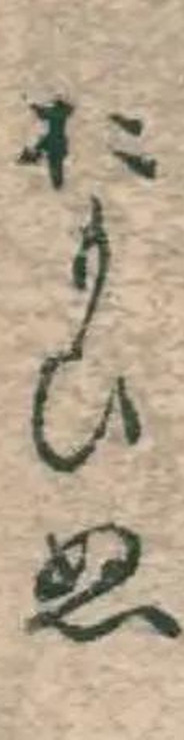おもひぬ
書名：百鬼徒然袋 3巻. [1]
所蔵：国立国会図書館 National Diet Library, JAPAN
